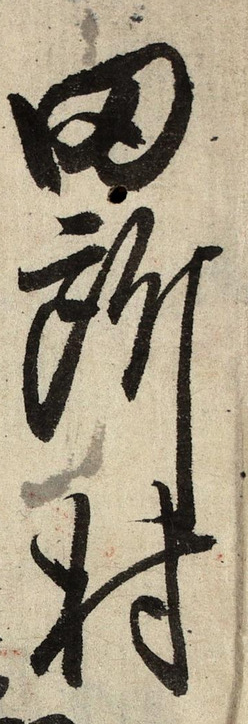田所村
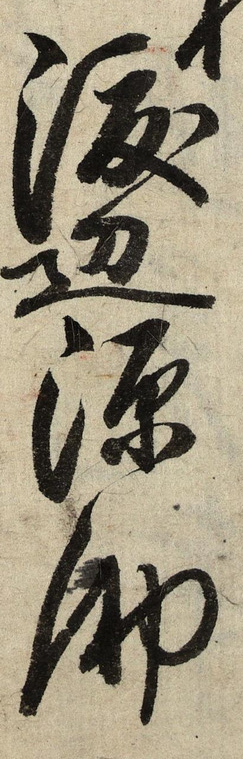渡辺源助
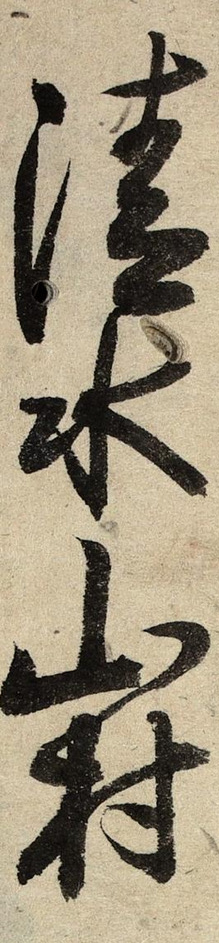清水山村
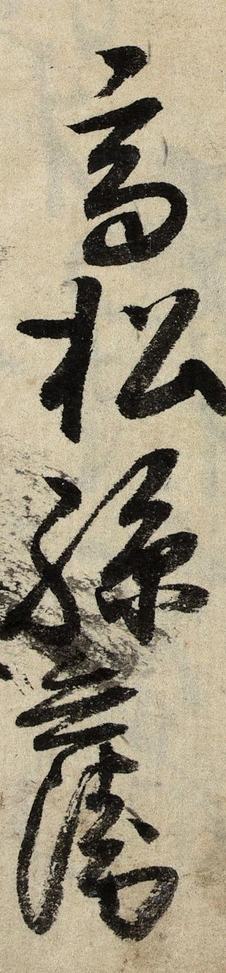高松孫兵衛
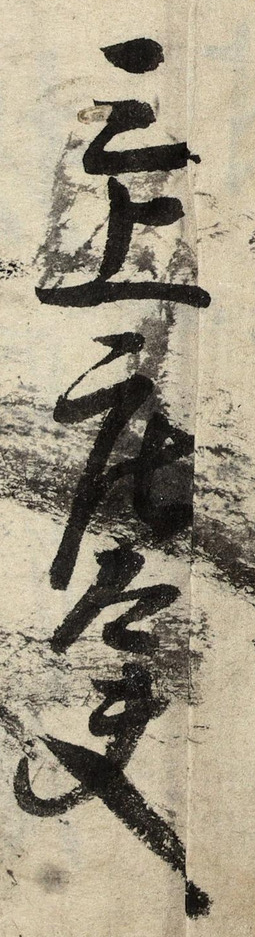三上庄太夫
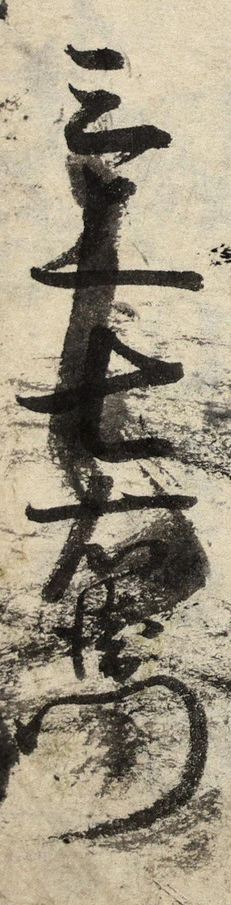三上七右衛門

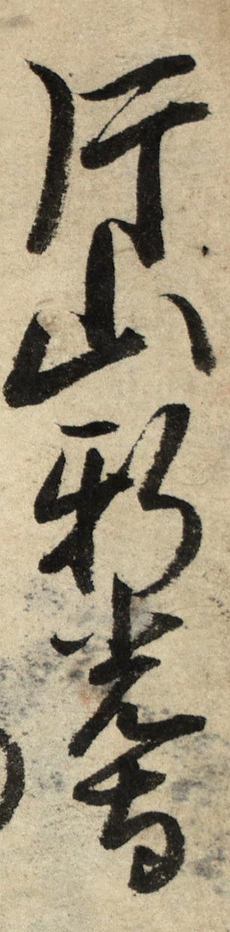片山新光寺
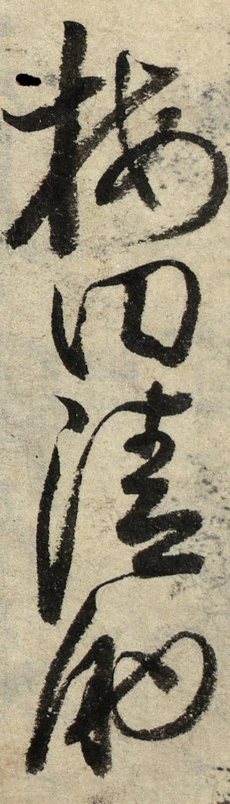梅田清助
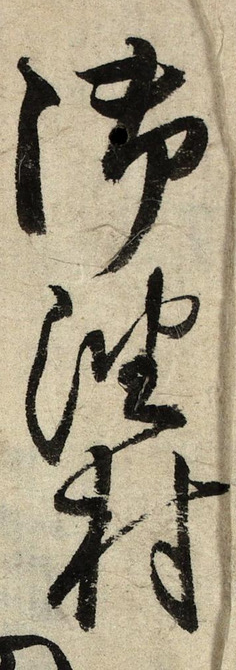御油村
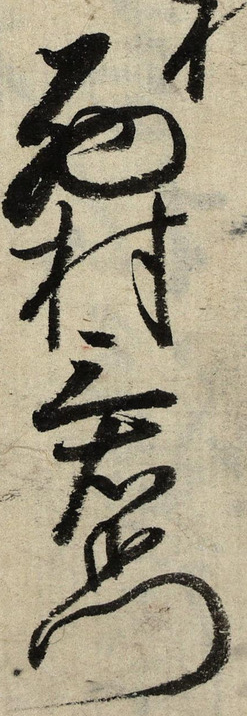西村三右衛門
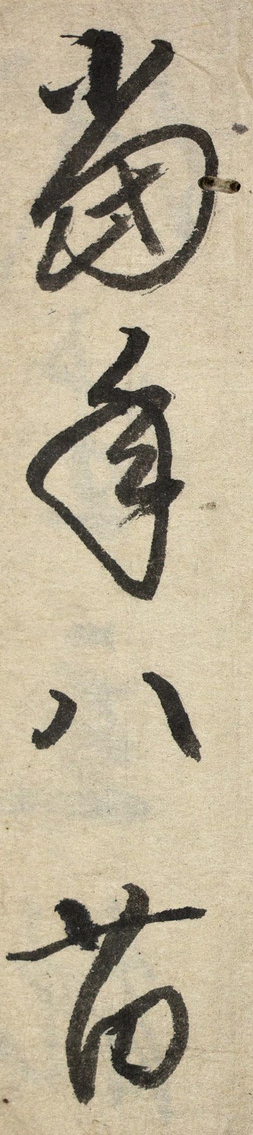當年八苗

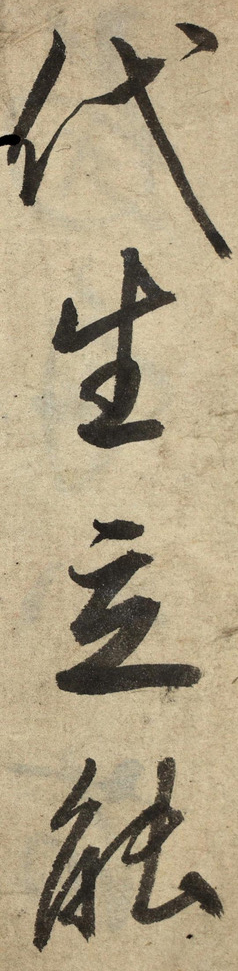代生立触
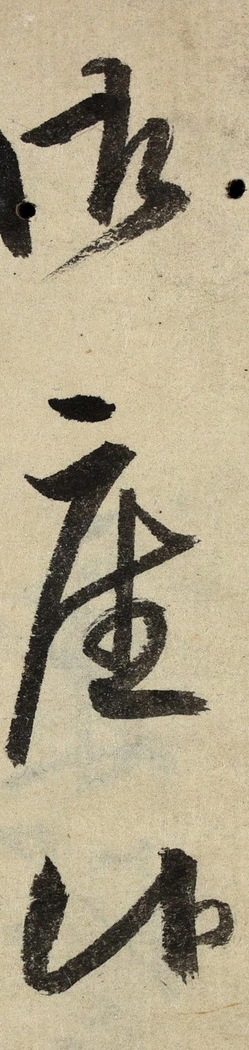御座候
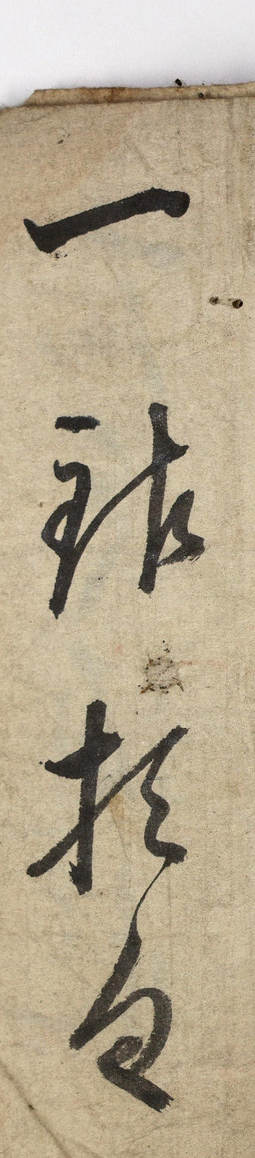一銀拾匁

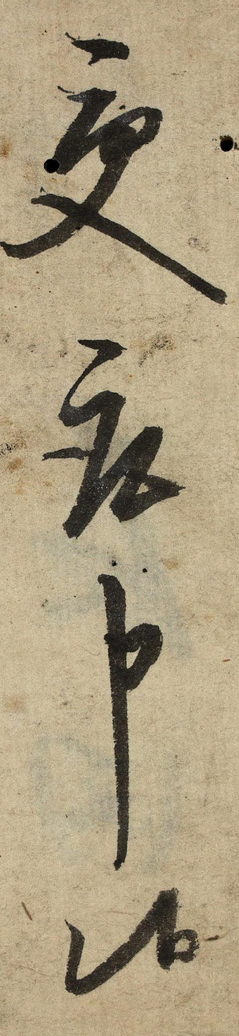受取申候

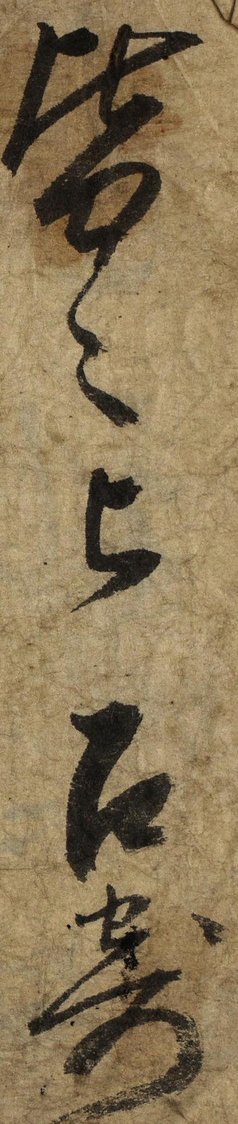皆々被召寄
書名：村尽（合谷・南居・三尾野等村々、敦賀県・足羽県等、受取等例文…
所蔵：福井県文書館 Fukui Prefectural Archives
